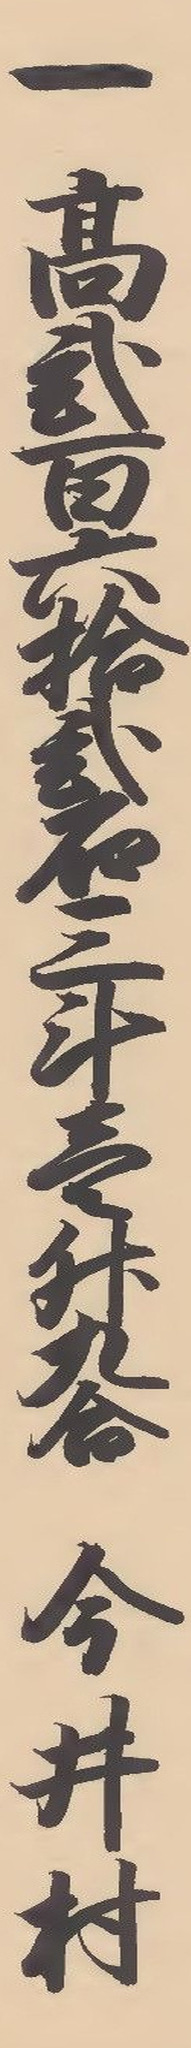一高弐百六拾弐石三斗壱升九合今井村
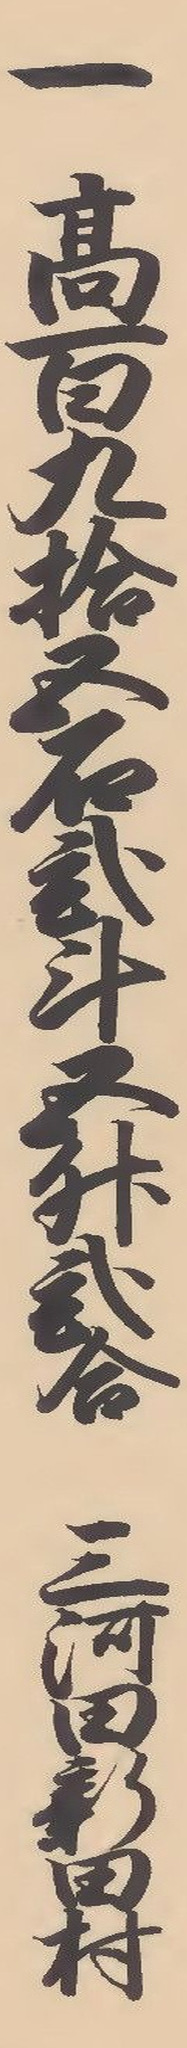一高百九拾五石弐斗五升弐合三河田新田村
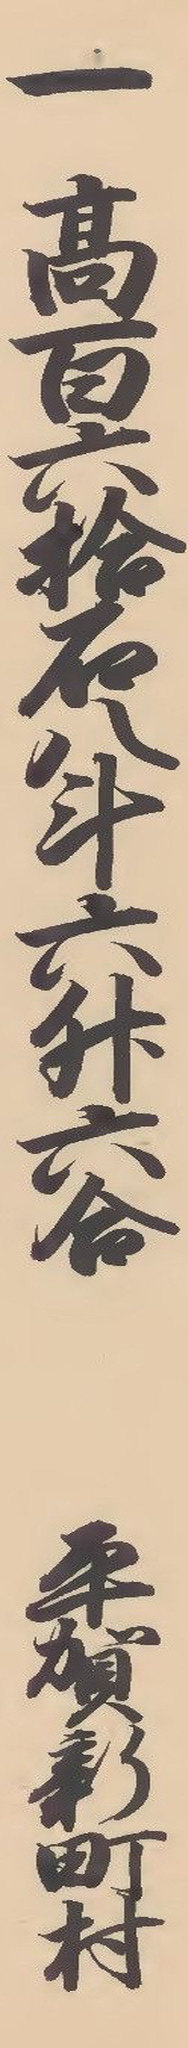一高百六拾石八斗六升六合平賀新町村
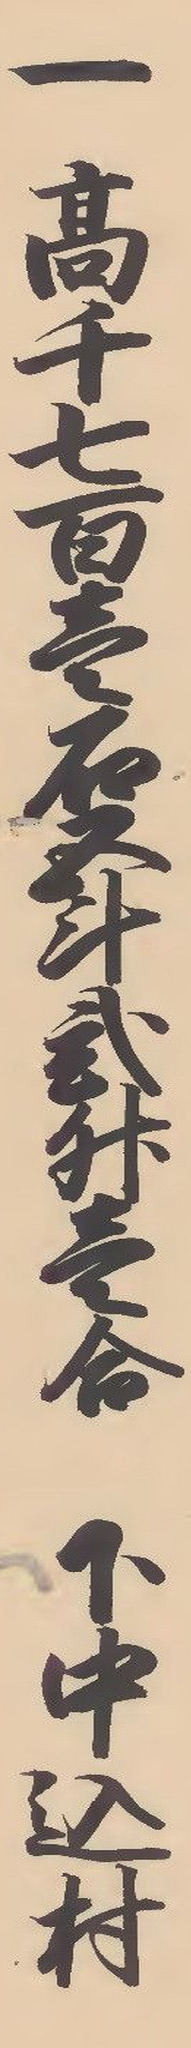一高千七百壱石五斗弐升壱合下中込村

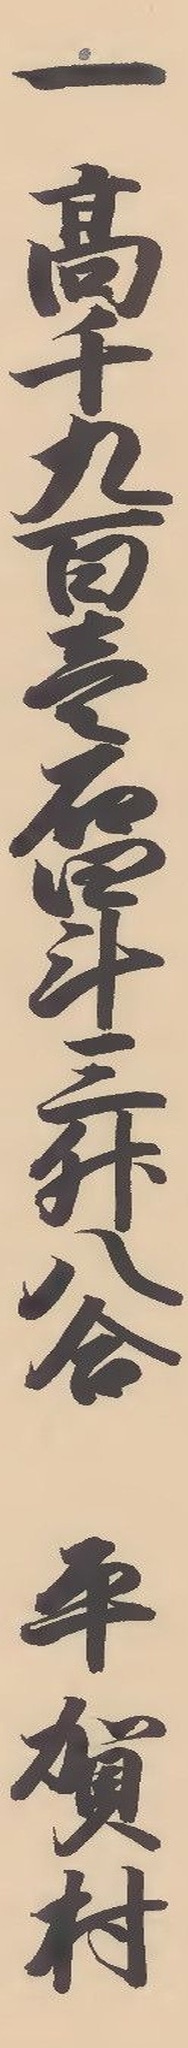一高千九百壱石四斗三升八合平賀村
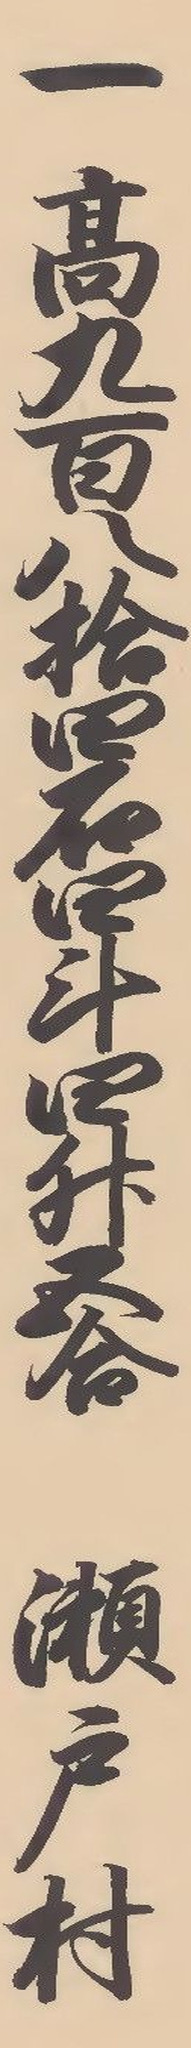一高九百八拾四石四斗四升五合瀬戸村
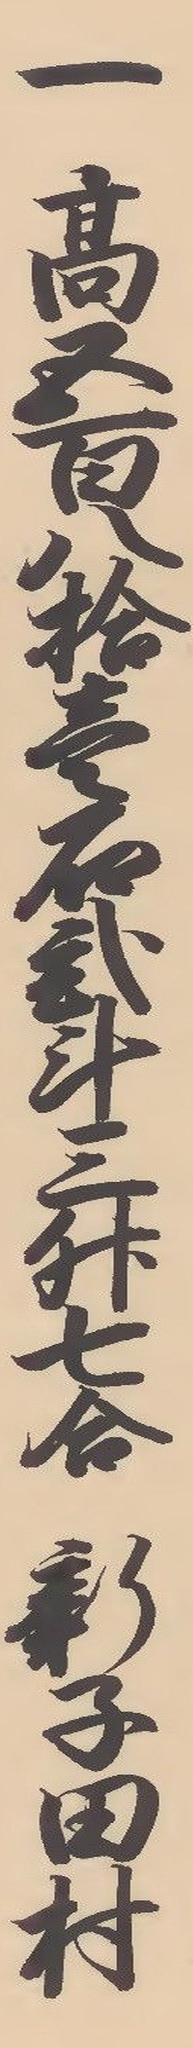一高五百八拾壱石弐斗三升七合新子田村
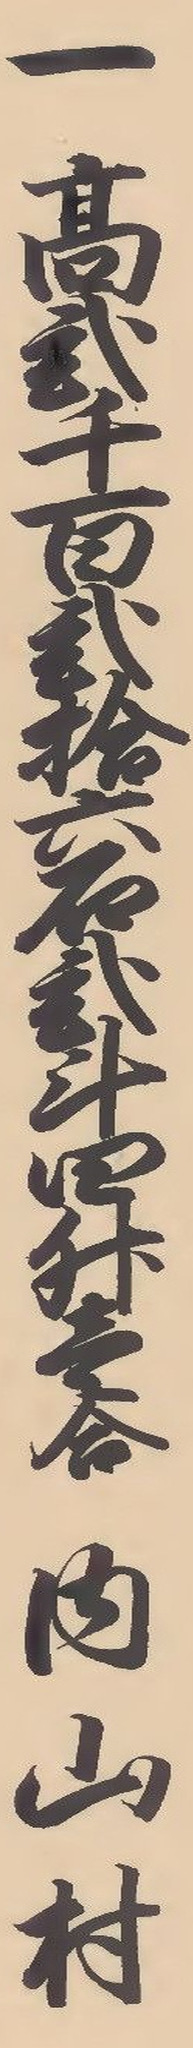一高弐千百弐拾六石弐斗四升壱合内山村
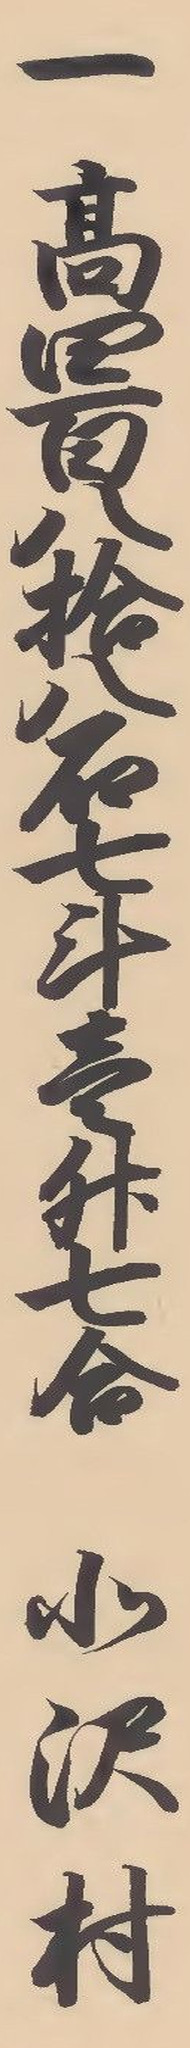一高四百八拾八石七斗壱升七合北沢村
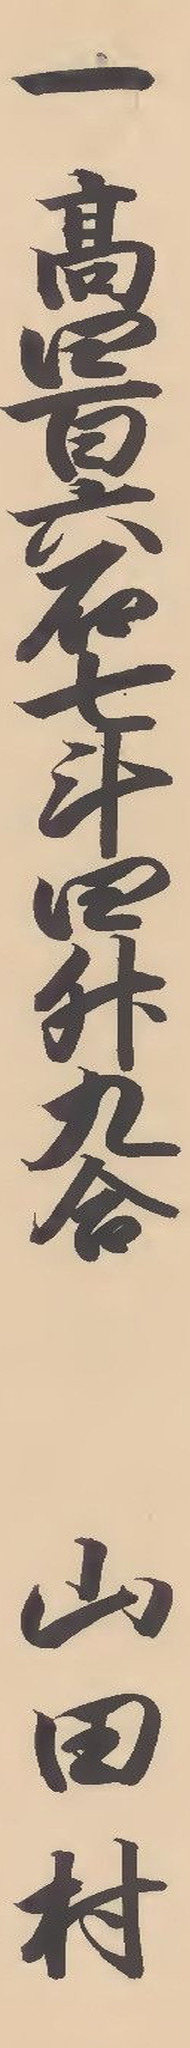一高四百六石七斗四升九合山田村
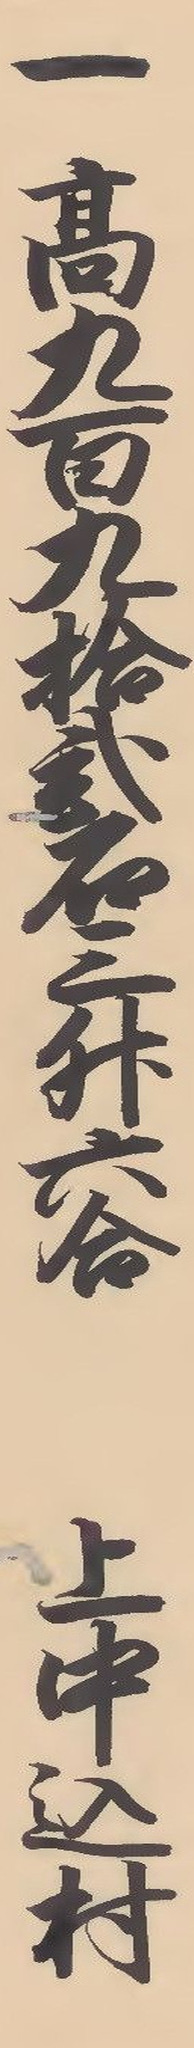一高九百九拾弐石三升六合上中込村

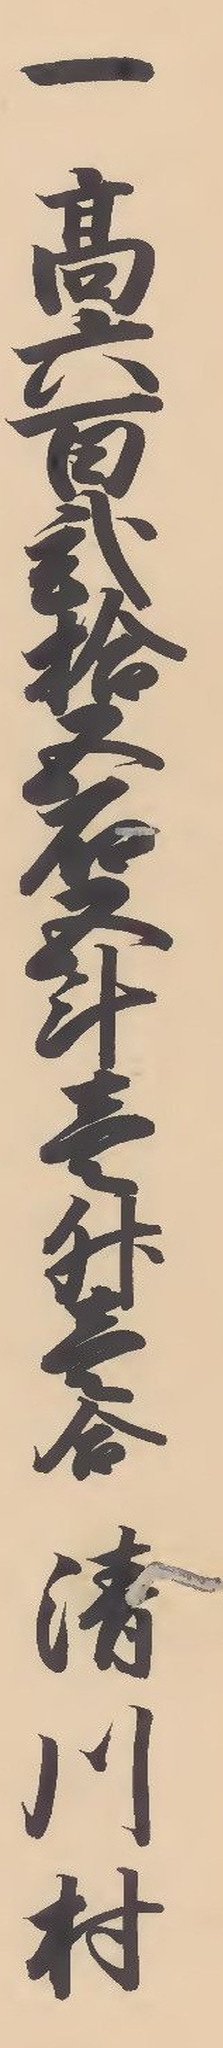一高六百弐拾五石五斗壱升壱合清川村
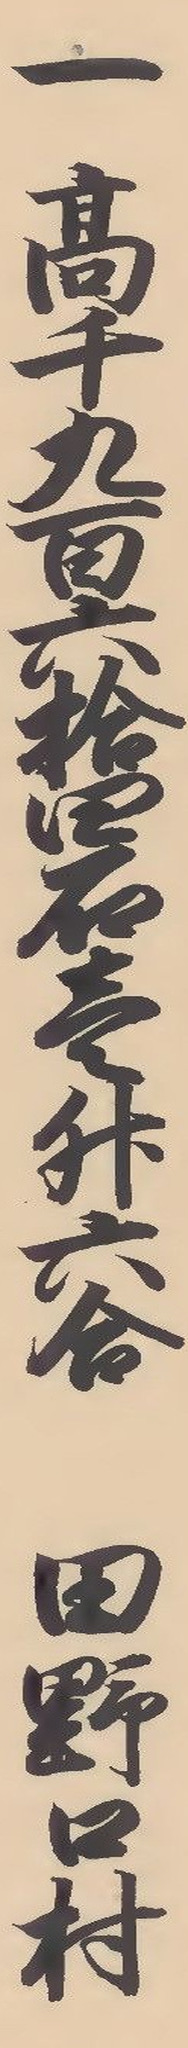一高千九百六拾四石壱升六合田野口村
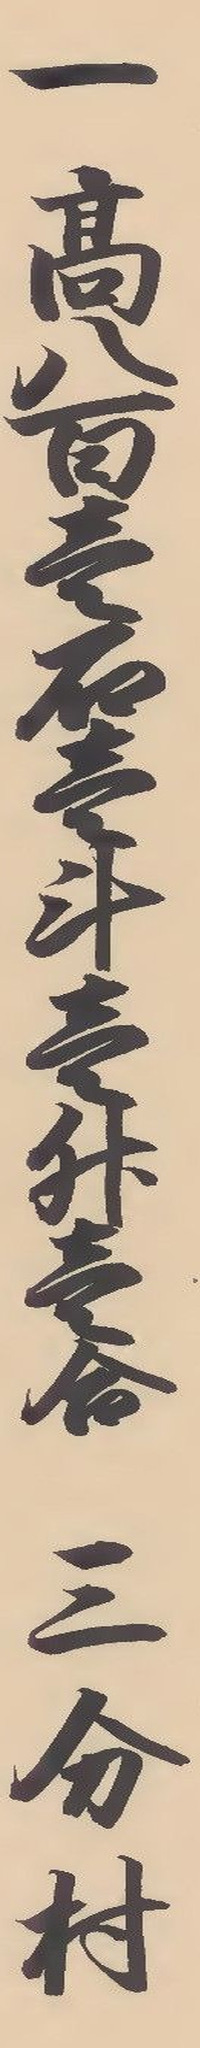一高八百壱石壱斗壱升壱合三分村
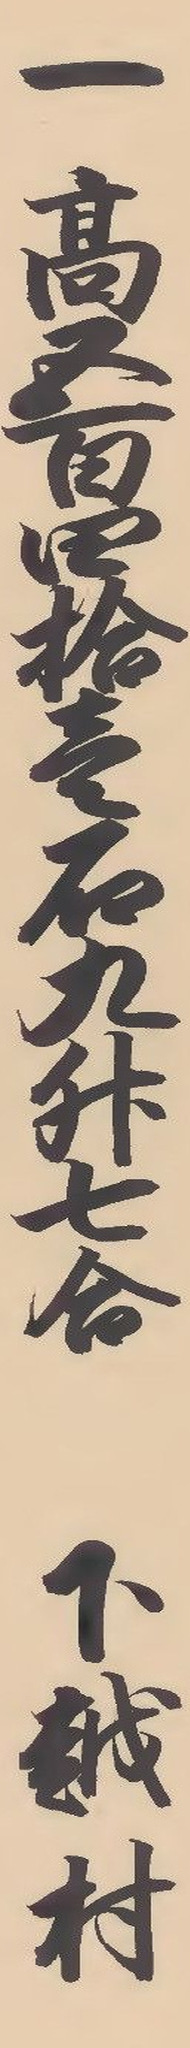一高五百四拾壱石九升七合下越村
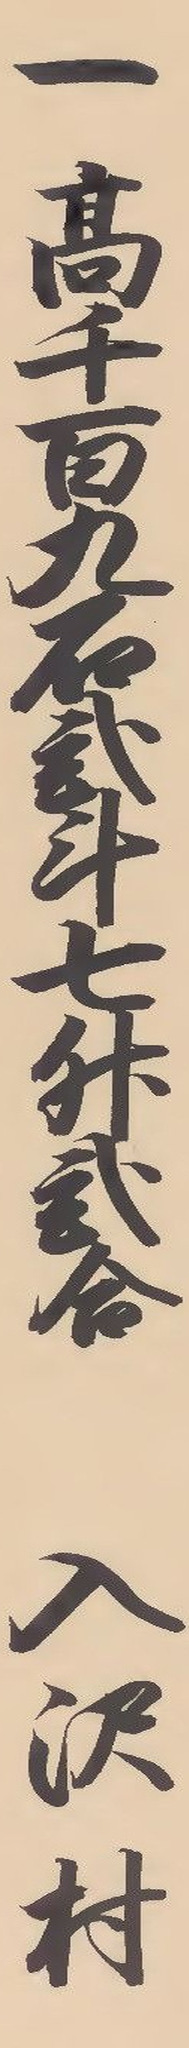一高千百九石弐斗七升弐合入沢村
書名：信濃国郷帳
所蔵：国立公文書館 National Archives of Japan
